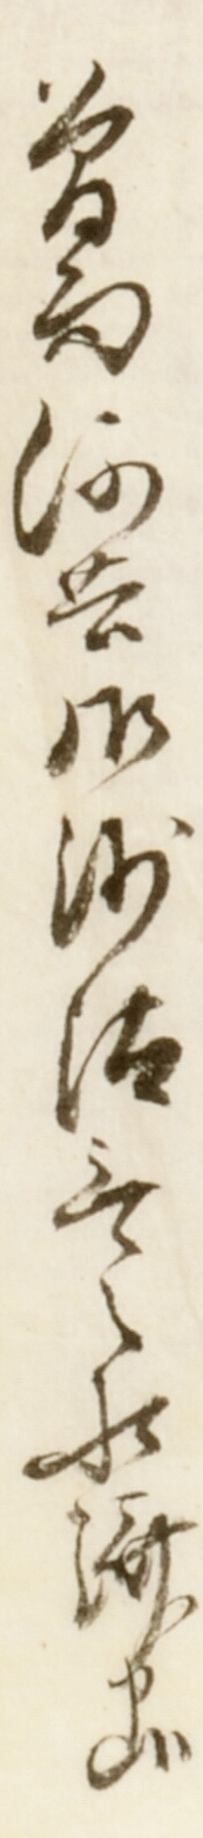曽而何共御沙汰無之相済申候
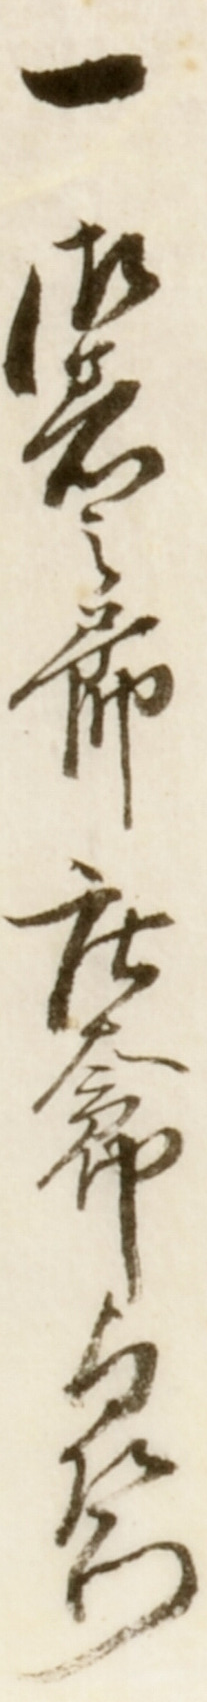一御着之節庄太郎与左衛門
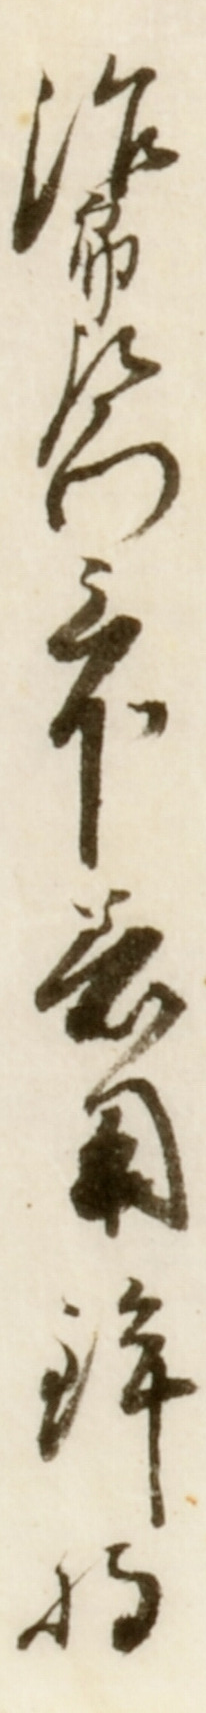治郎左衛門上下着用鉾持
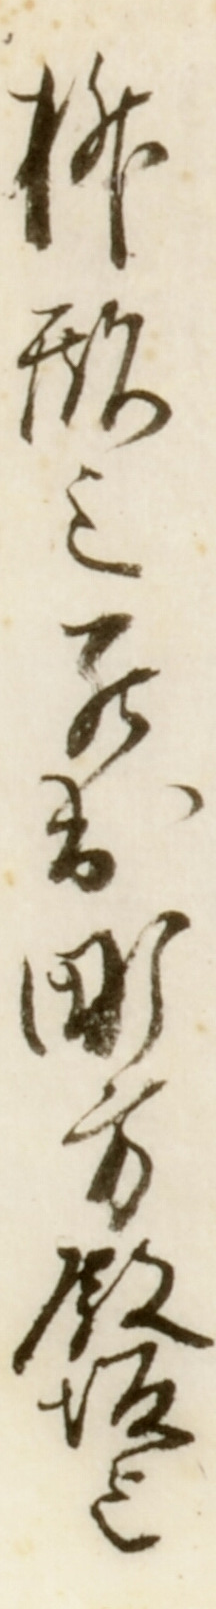桝形迄罷出町方殿坂迄

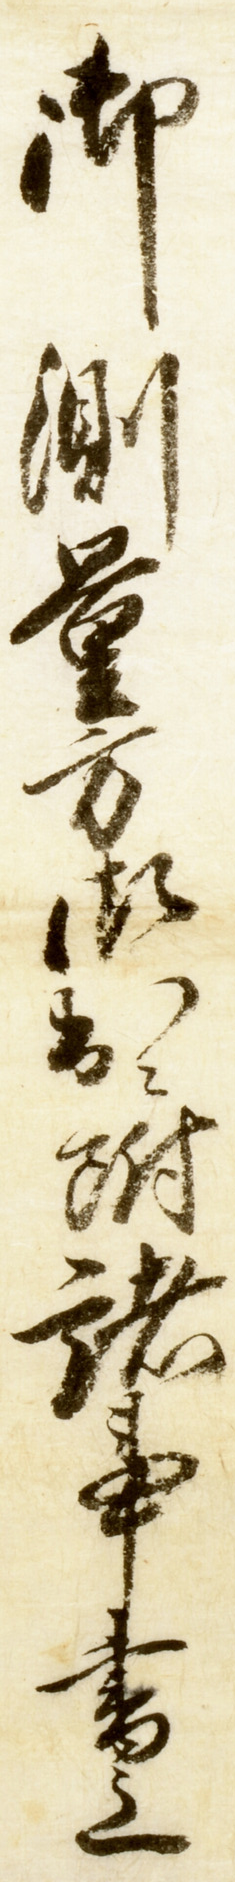御測量方御出ニ附諸事書上
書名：諸事書上
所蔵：伊那市立高遠町図書館・合同会社AMANE
